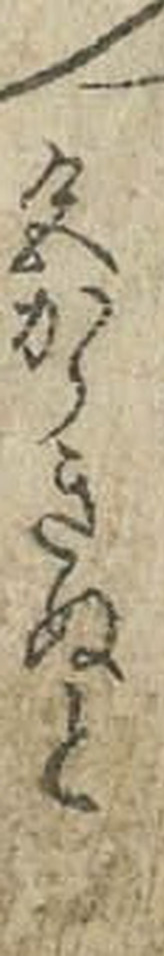色からきぬと
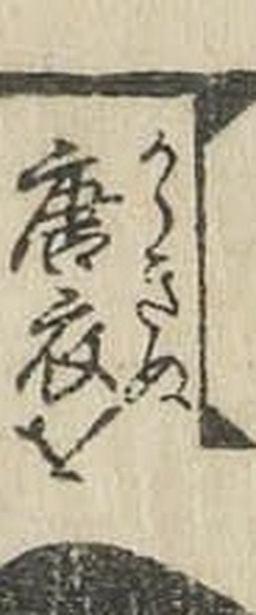唐衣を
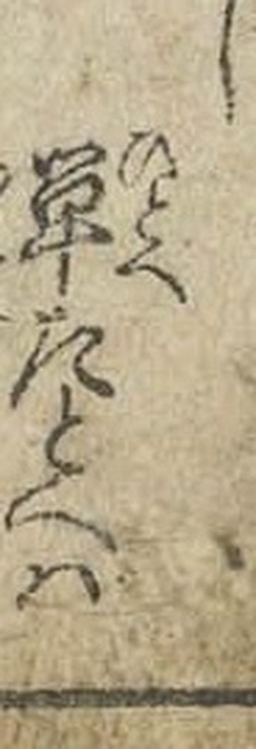単たとへは
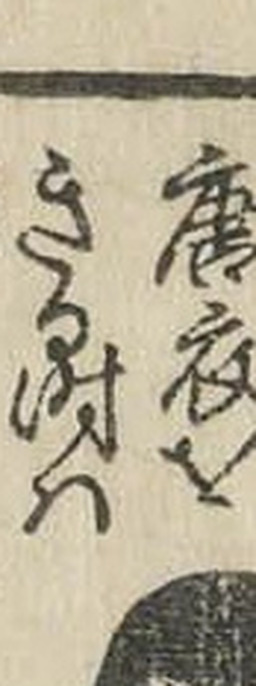きる時は
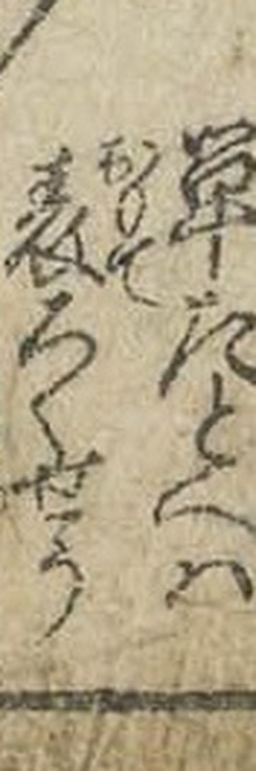表ろくせう
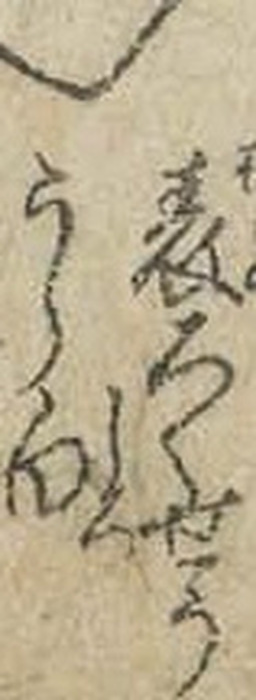うら白
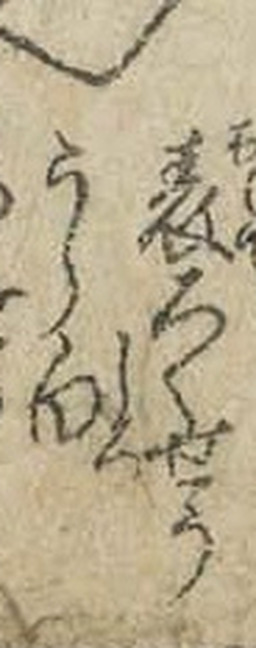うら白
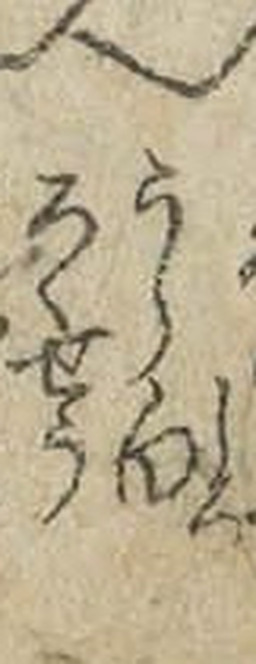ろくせう
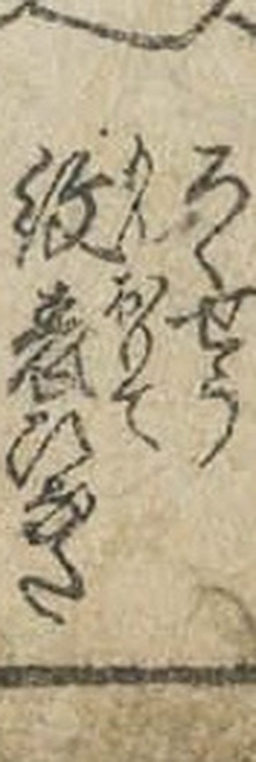紋表ひなた
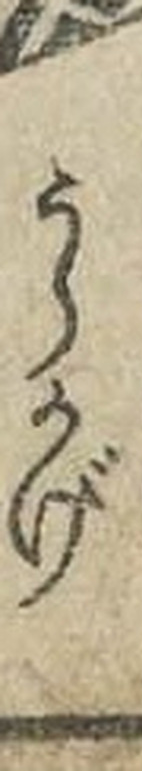うらかげ
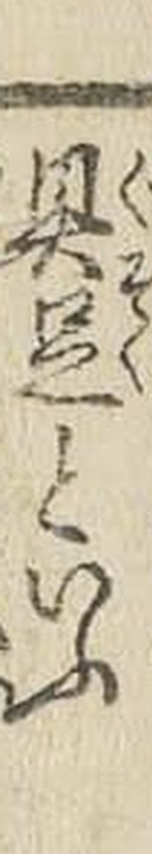具足といふ
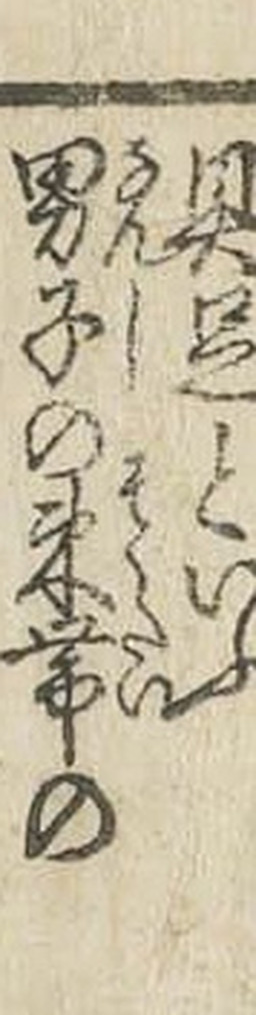男子の束帯の
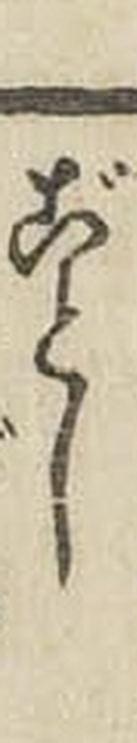ごとし
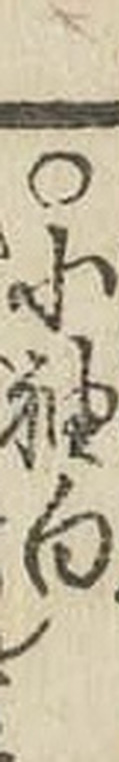○小袖白
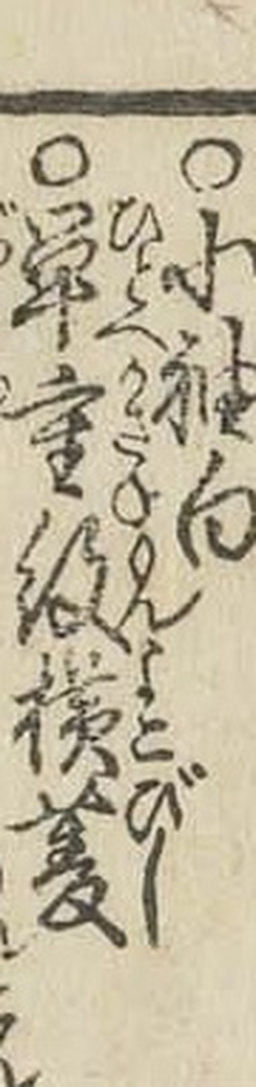○単重紋横菱
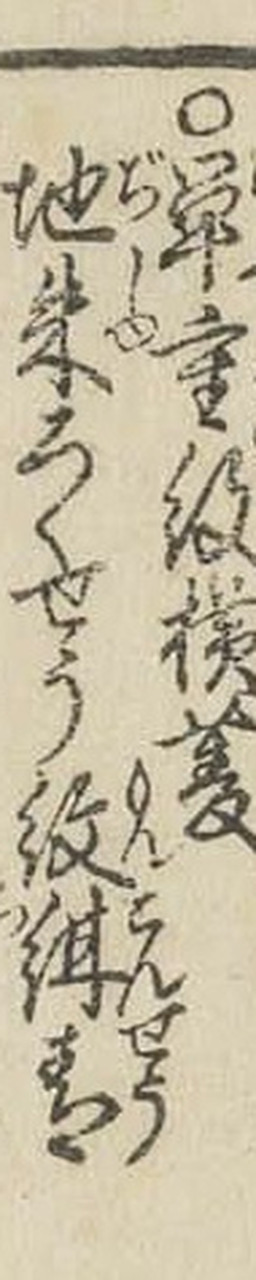地朱ろくせう紋紺青
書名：絵本写宝袋 9巻 1之巻
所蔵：東京学芸大学教育コンテンツアーカイブ
